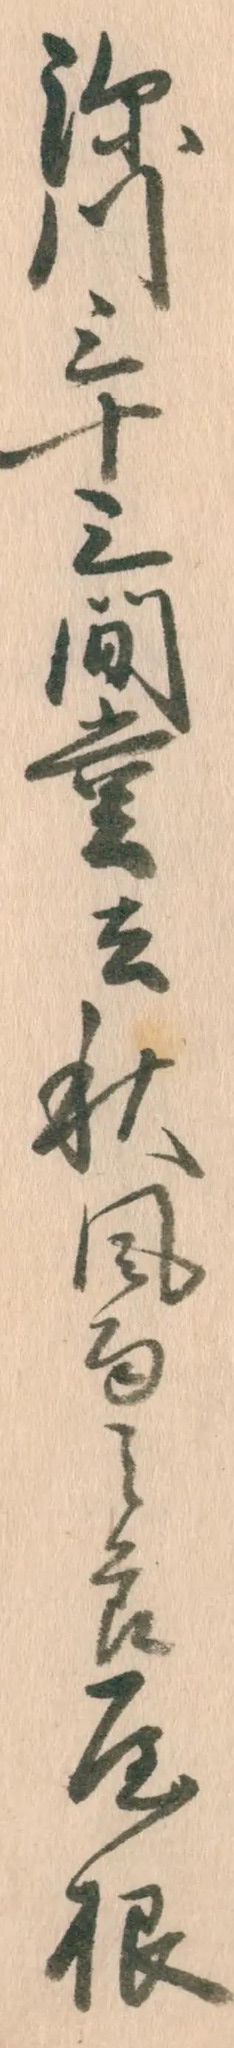深川三十三間堂去秋風雨之節屋根
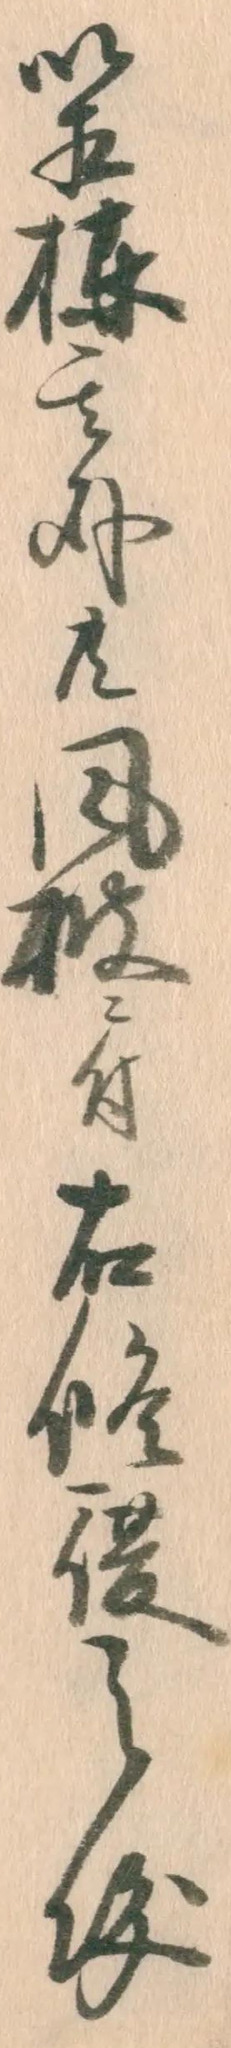箱棟其外共風破に付右修復之儀

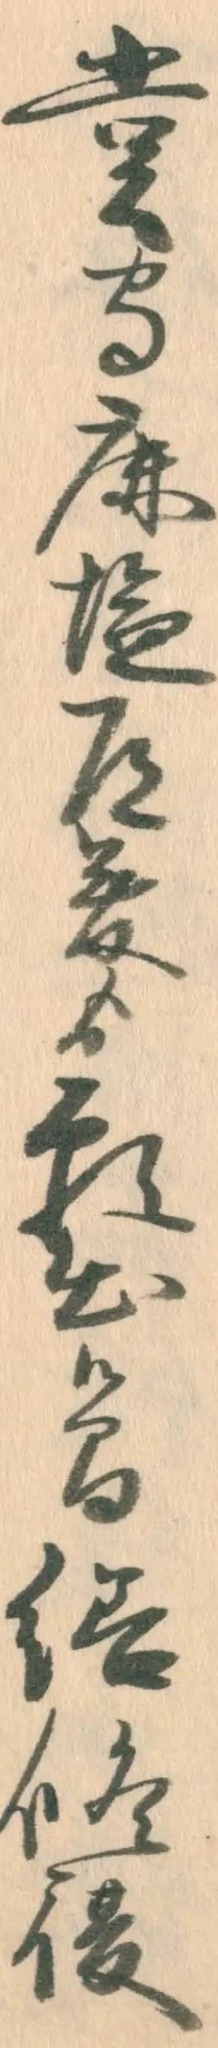堂守鹿塩道菅ゟ願出候間繕修復
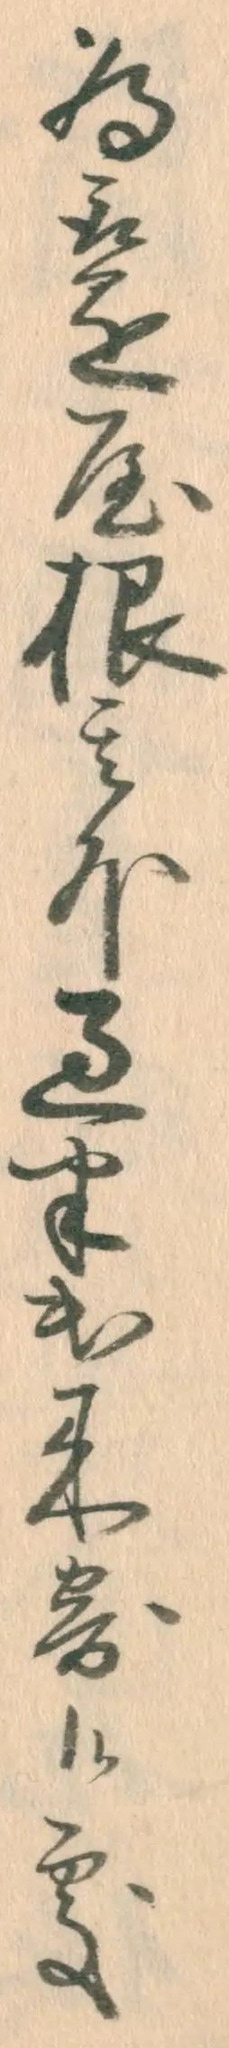為取懸屋根其外過半出来寄候処
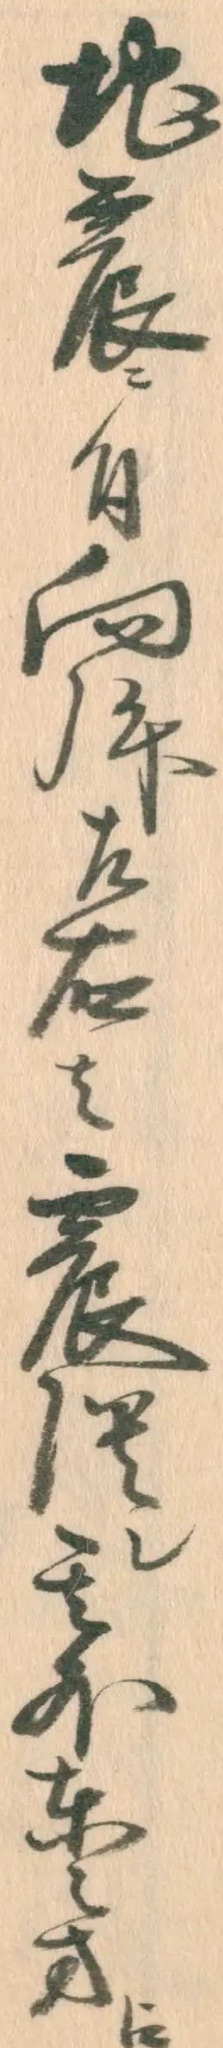地震に付向拝左右は震潰れ其外共東之方江
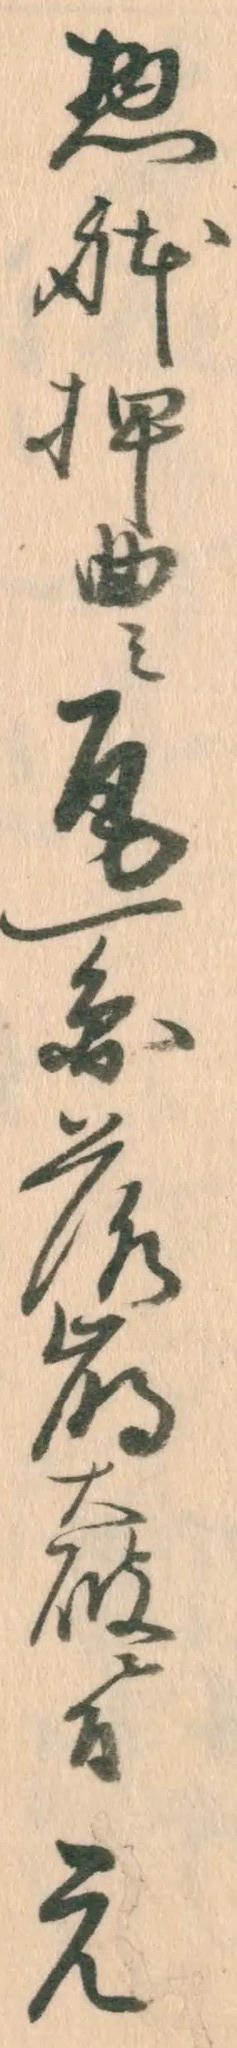惣体押曲み瓦一円落崩大破に付元
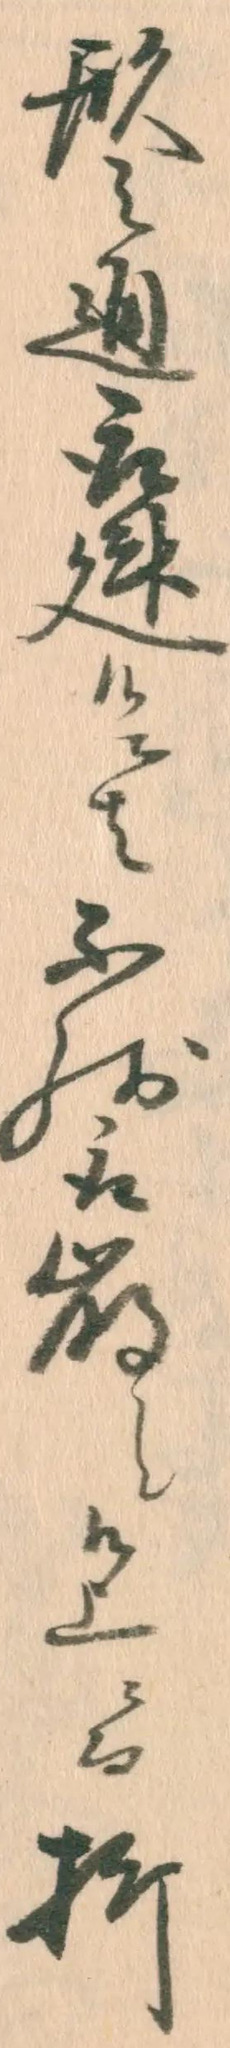形之通取建候には不残取崩し候上ニ而折
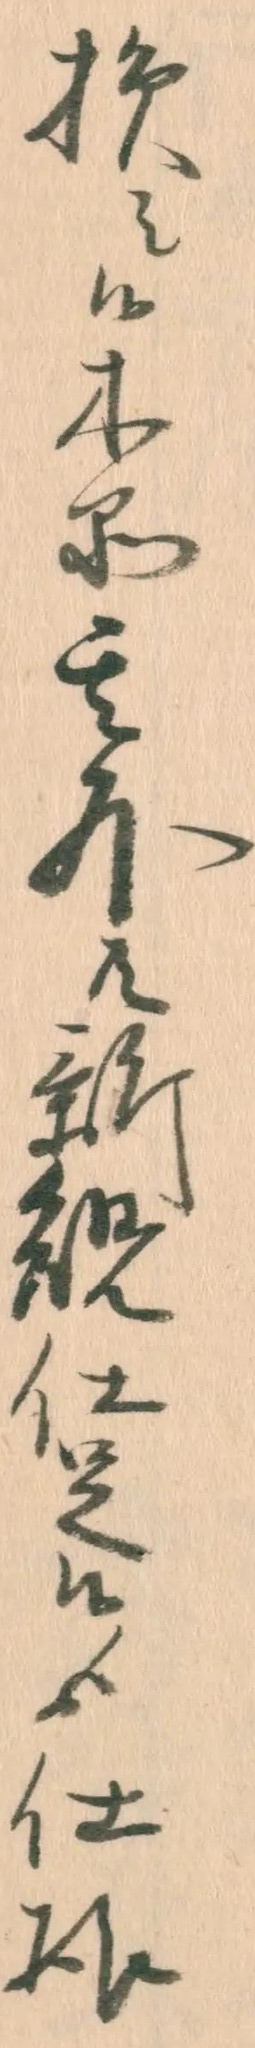損し候木品其外共新規仕足候ゟ仕様
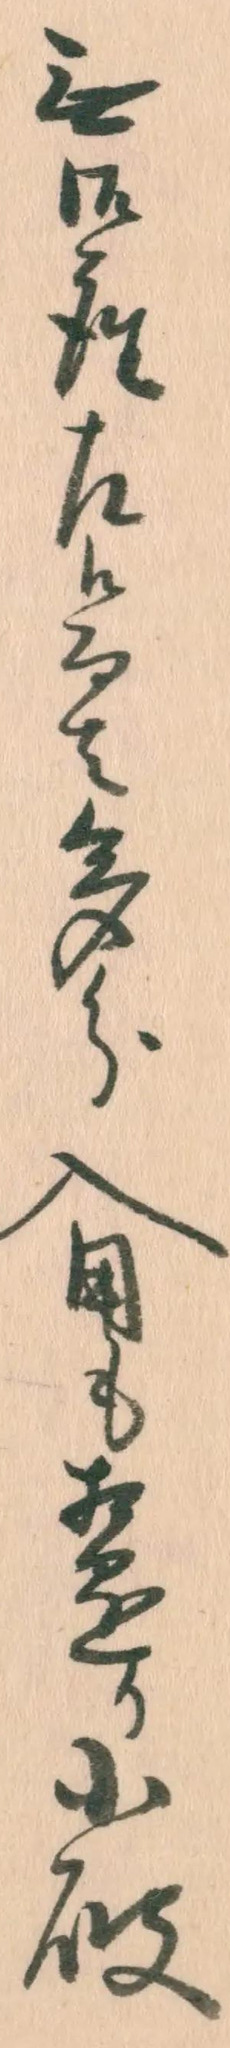無御座左候而は多分入用も相懸り小破
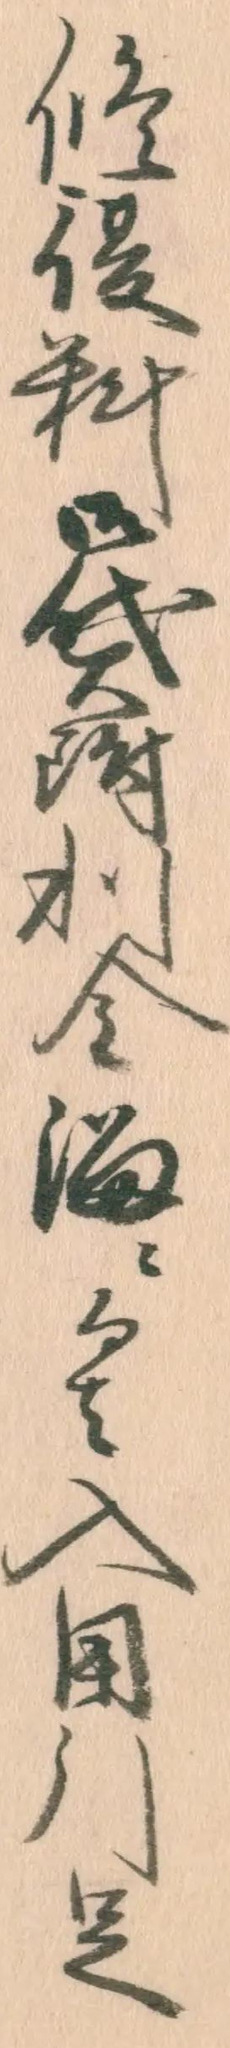修復料御貸附利金溜に而は入用引足
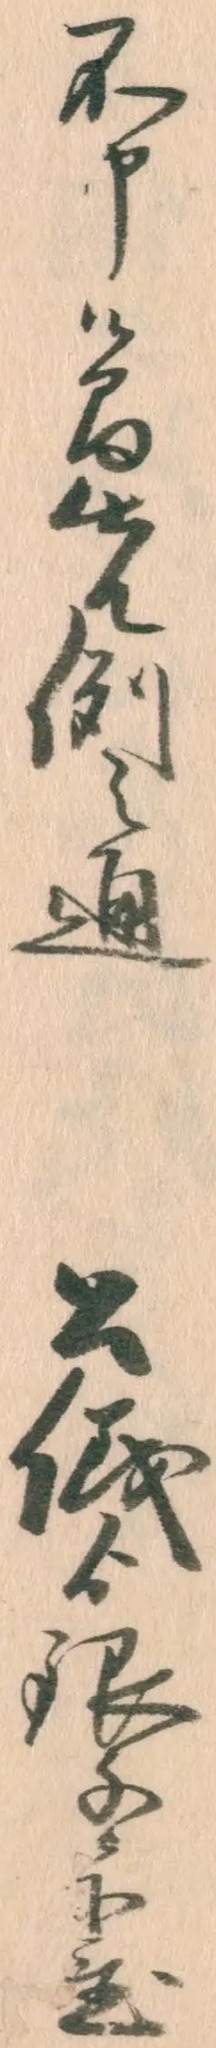不申候間先例之通公儀ゟ銀子被下置
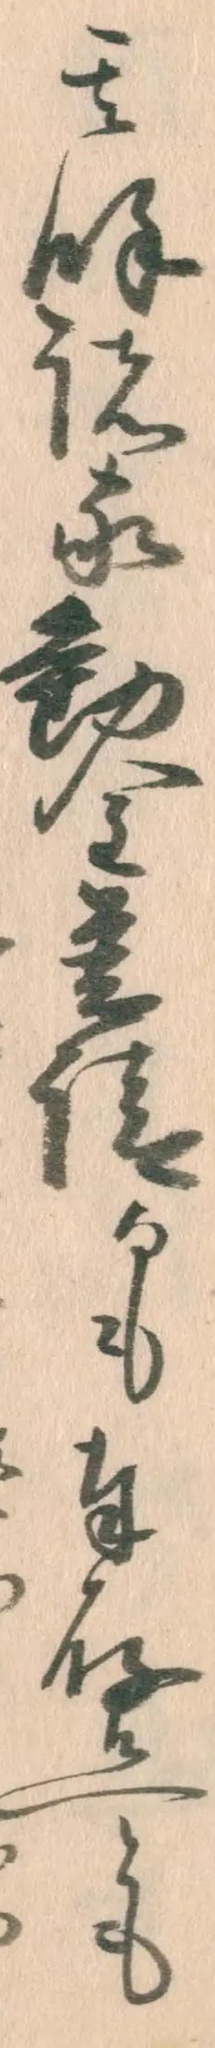其余諸家勧金普請与も奉存候へとも
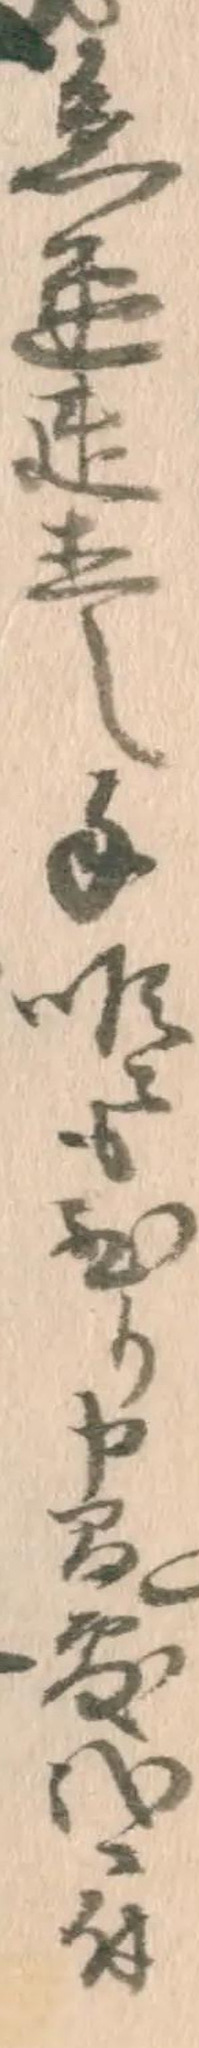○建直し手順にも至り申間敷哉ニ付
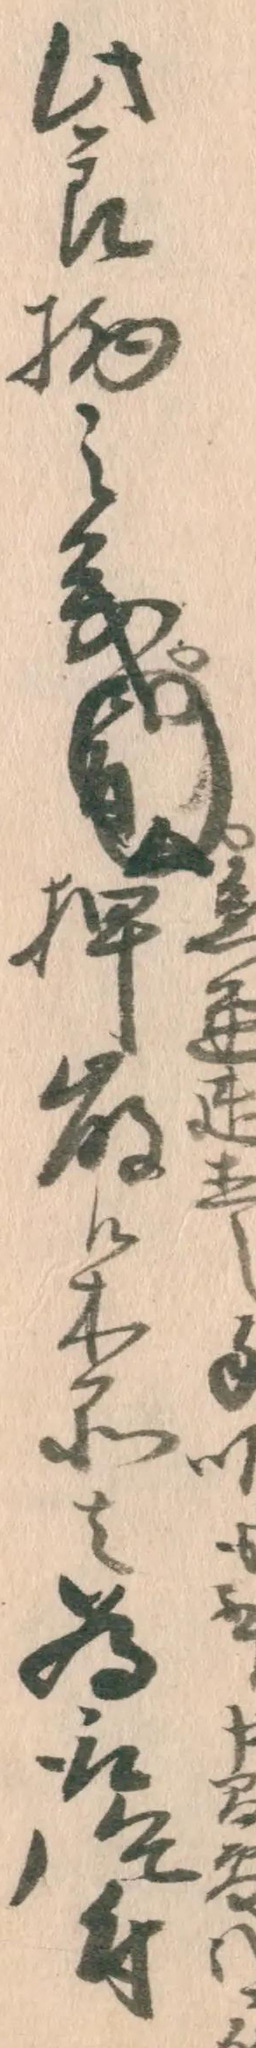此節柄之義○押崩候木品は為取仰付
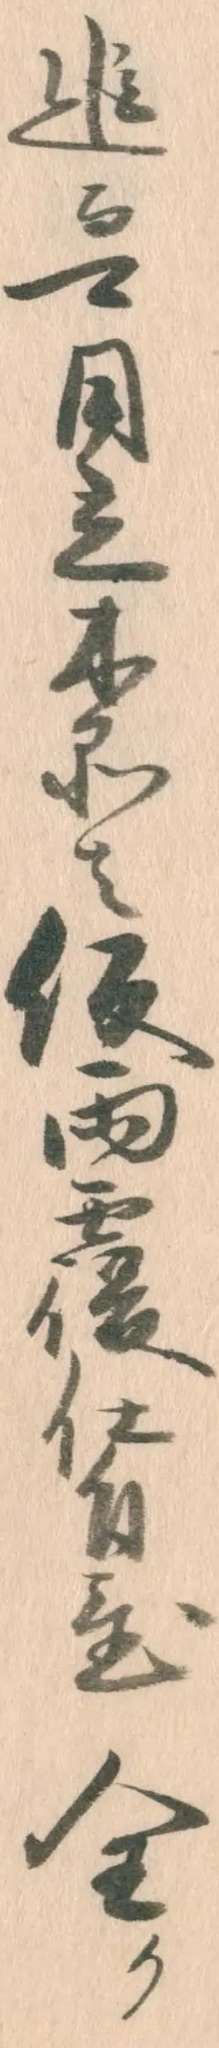追而可用立木品は仮雨覆仕付置全く

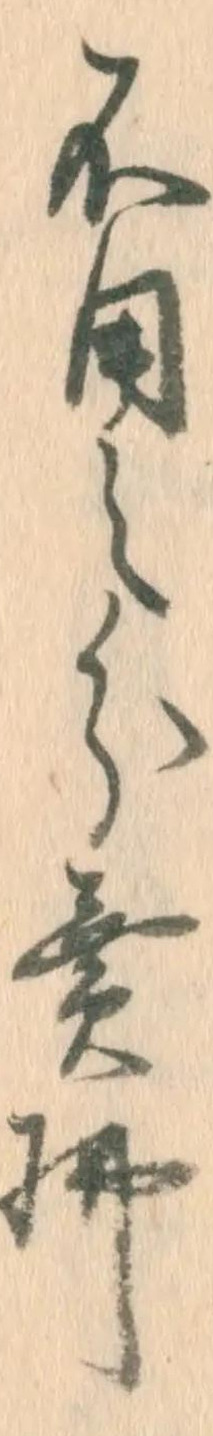不用之分売払
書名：三十三間堂. [1]
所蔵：国立国会図書館 National Diet Library, JAPAN
